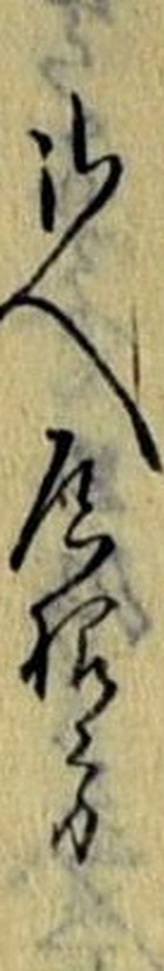弐人屋根方
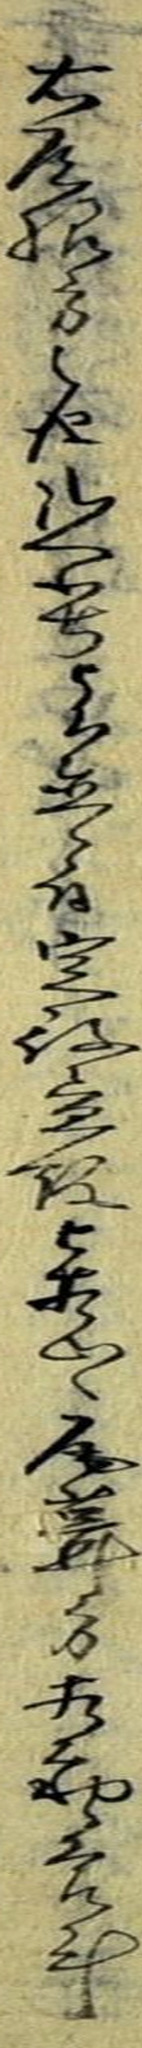右屋根方之儀弐人ふち被下置候に付定役昼飯被相止候瓦葺方相勤候節斗
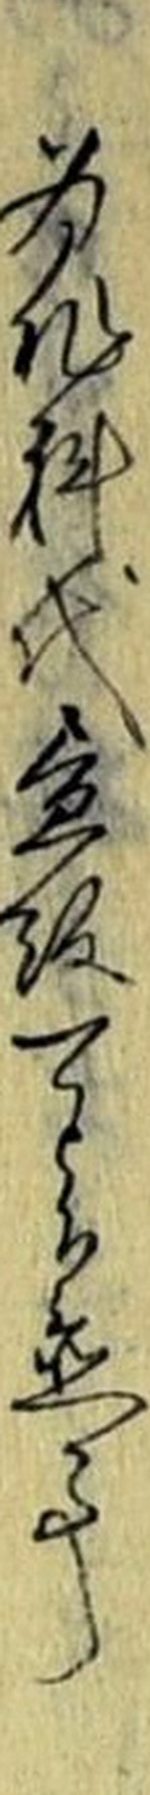為作料代昼飯可被下置事
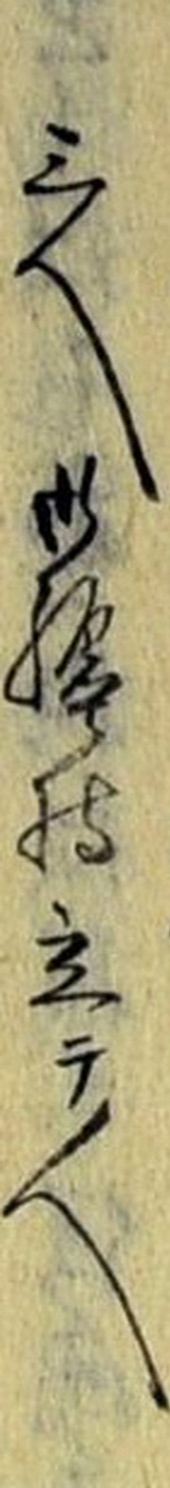三人御纏持立テ人
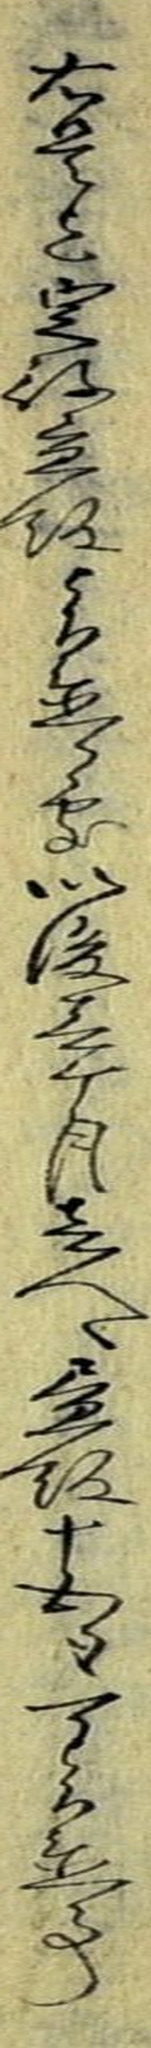右是迄定役昼飯被下置候処以後壱ヶ月壱人へ昼飯十五つヽ可被下置事
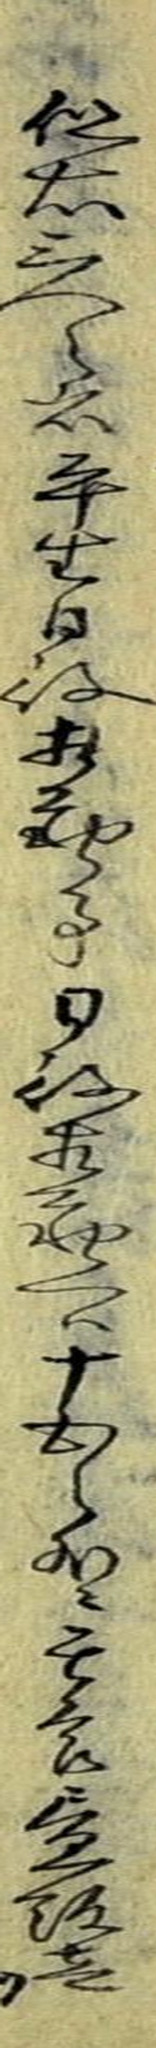但右三人之者平生日役相勤候事日役相勤候へは十五之外に其節昼飯壱つ
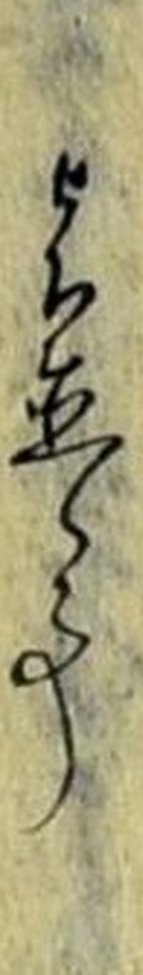被下置候事
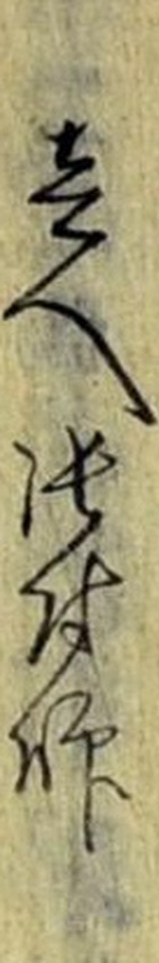壱人張付師
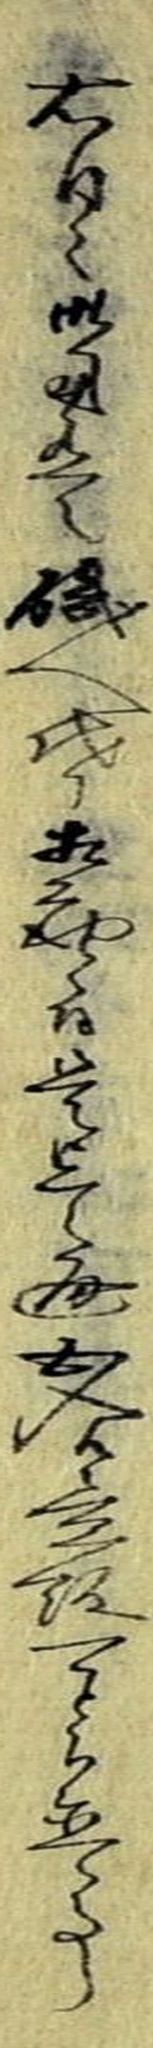右日々御用有之職人代り相勤候付是迄之通五合昼飯可被下置候事
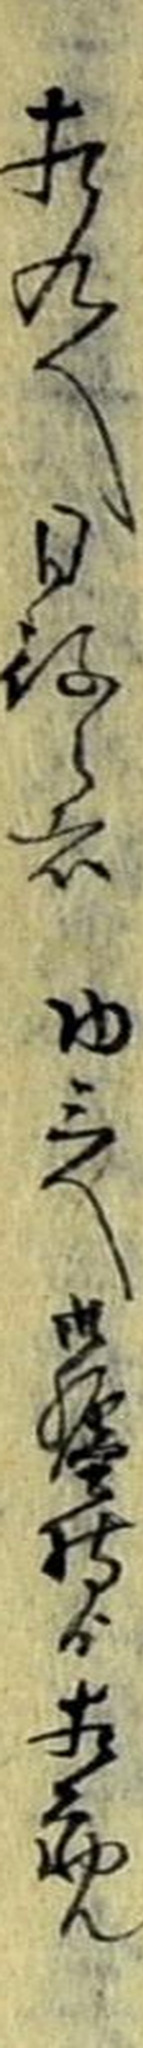拾九人日役之者内三人御纏持ゟ相勤ル
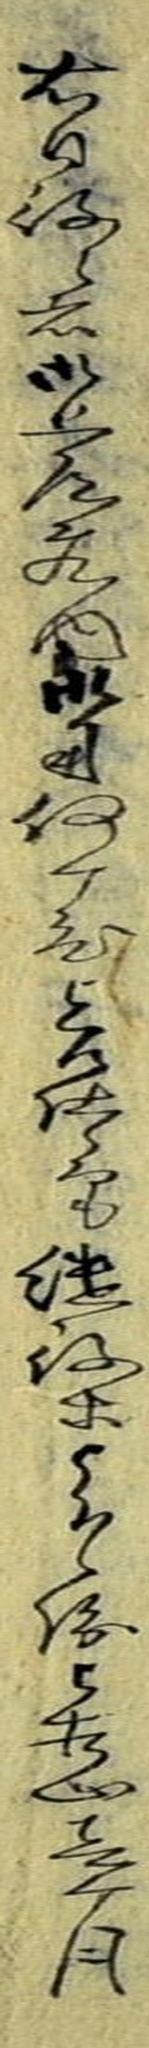右日役之者御上屋敷内御用何ヶ度迄召仕候而も継役等被下候儀被相止壱ヶ月
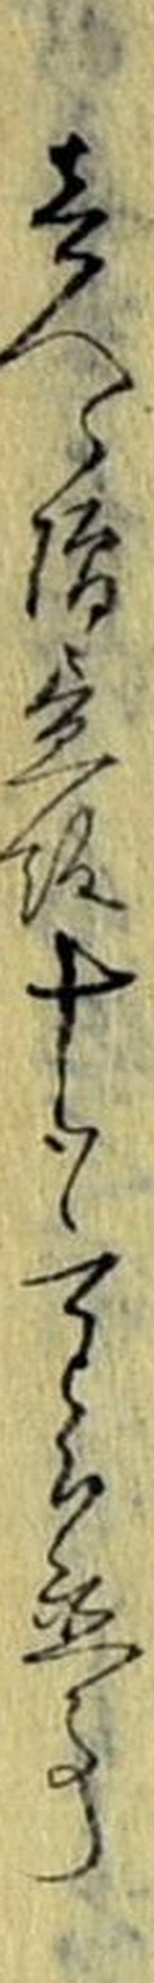壱人之増昼飯十ツゝ可被下置事

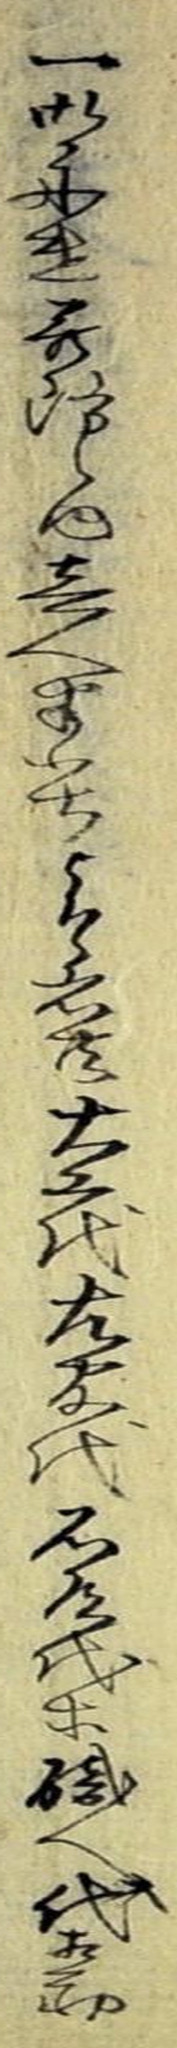一御舟遣并防之内壱人半ふち被下候者共大工代左官代石屋代等職人代相勤
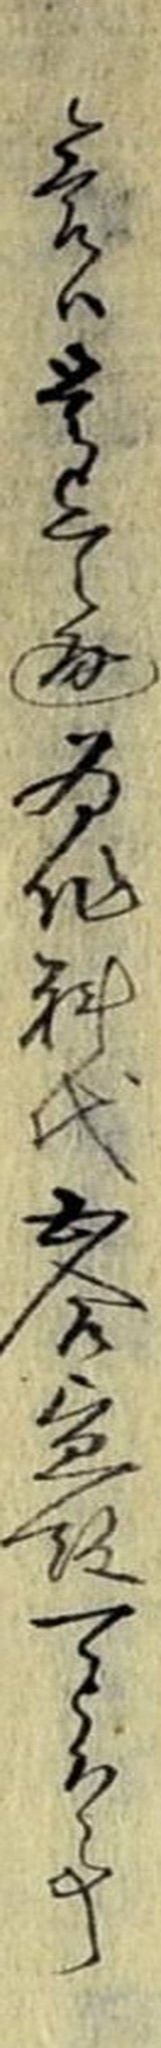候節は是迄之通為作料代五合昼飯可被下候事
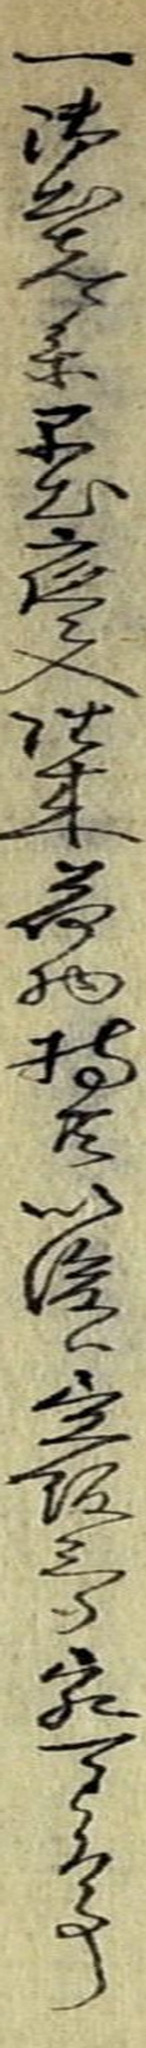一御出先へ参早出夜に入往来荷物持共以後は定飯三つ宛可被下候
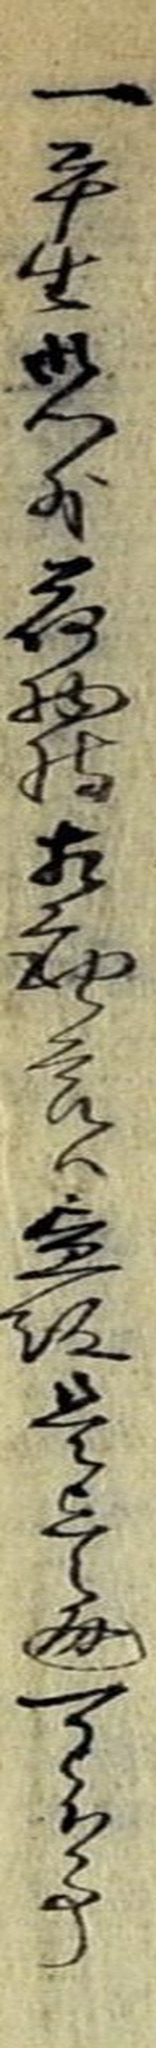一平生御門外荷物持相勤候節は昼飯是迄之通可被下事
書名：命令之部 四
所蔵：福井県文書館 Fukui Prefectural Archives
